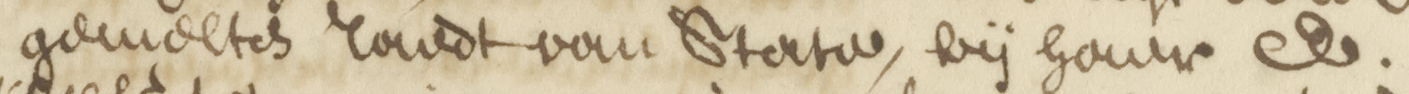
„gemelten Raedt van State, bij haer E.
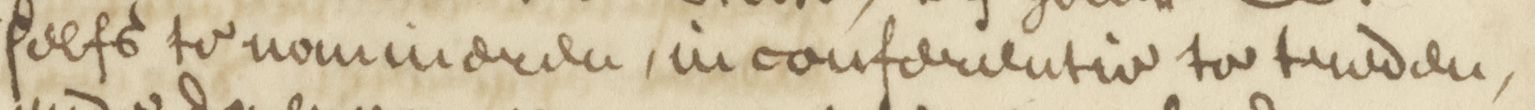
selfs te nomineren, in conferentie te treden,
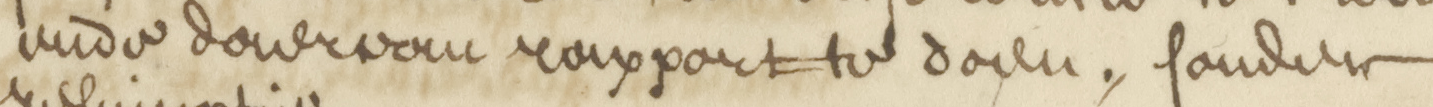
ende daervan rapport te doen, sonder
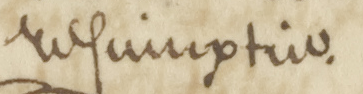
resumptie.
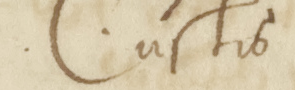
Custis
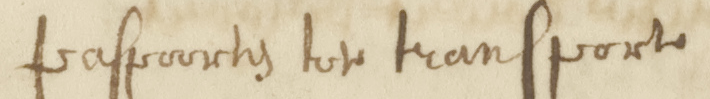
paspoorten tot transport
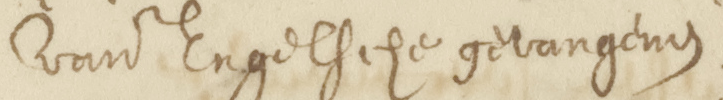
van Engelsche gevangenen
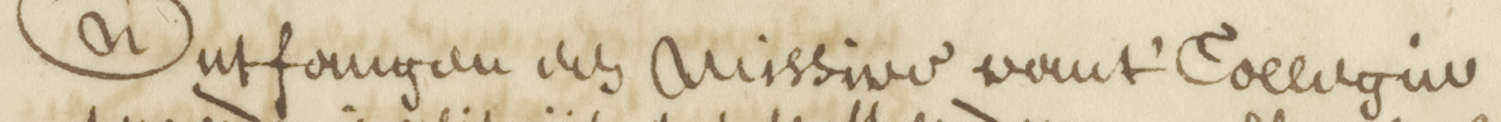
Ontfangen een Missive vant' Collegie
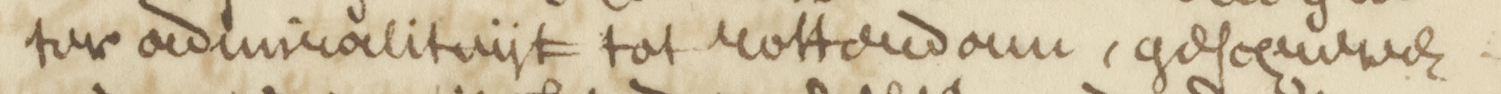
ter admiraliteijt tot rotterdam, geschreven
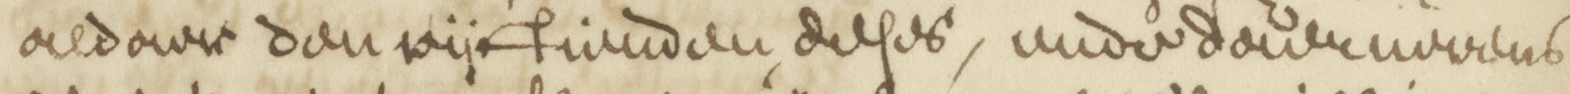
aldaer den vijftienden deses, ende daernevens
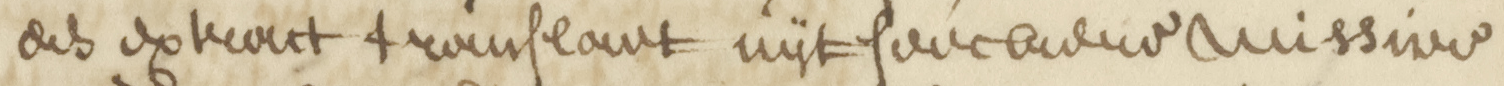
een extract translaet uijt seeckere Missive
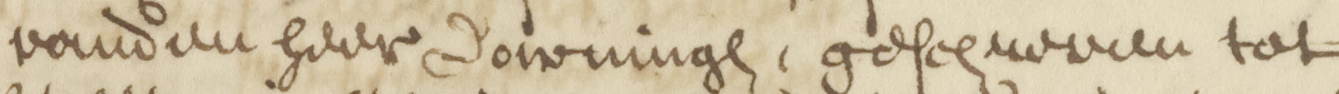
vanden heer Downingh, geschreven tot
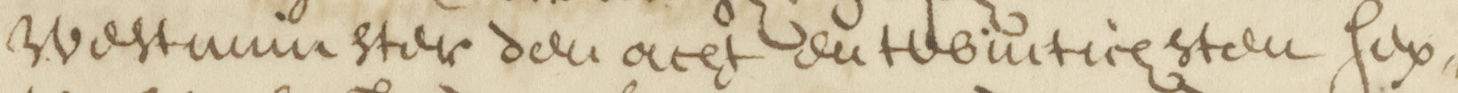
Westmunster den acht entwintichsten Sep„
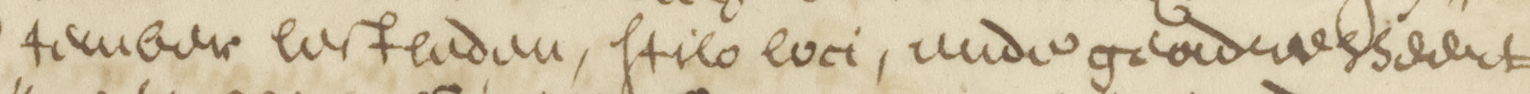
„tember lestleden, stilo loci, ende geadresseert
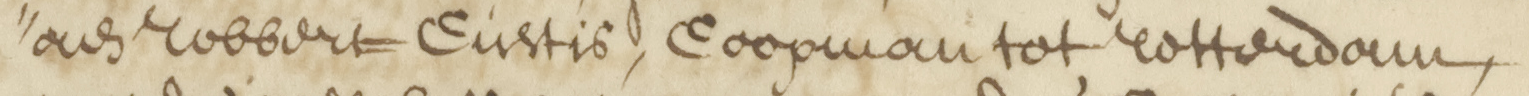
aen Robbert Custis, Coopman tot Rotterdam,
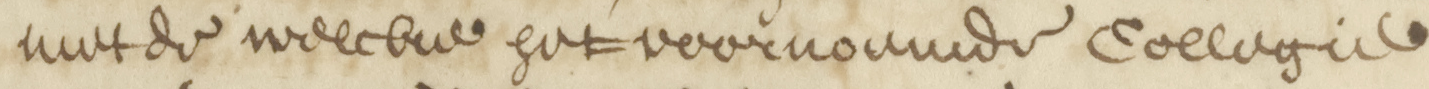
met de welcke het voornoemde Collegie
